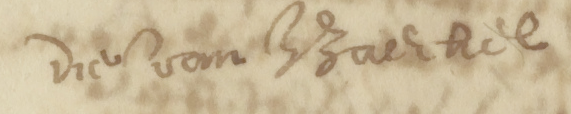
die van Baeckel
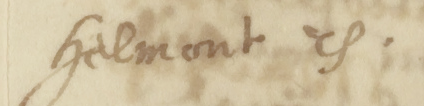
Helmont rs.
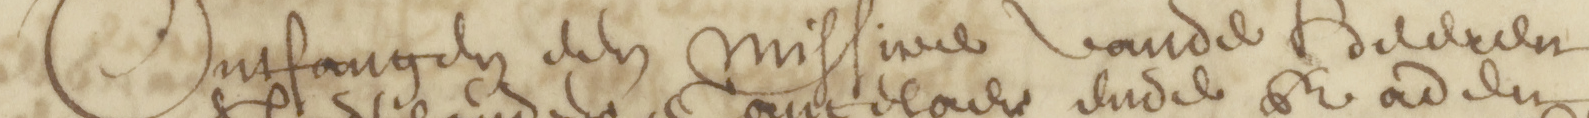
Ontfangen een Missive vande Heeren
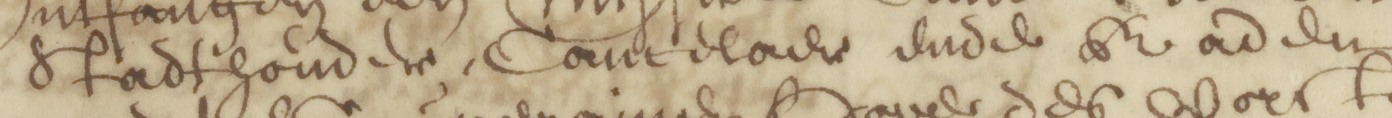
Stadthouder, Cancelaer ende Raden
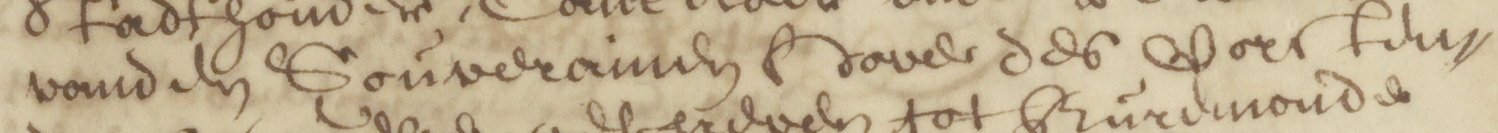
vanden Souverainen Hove des Vorsten„
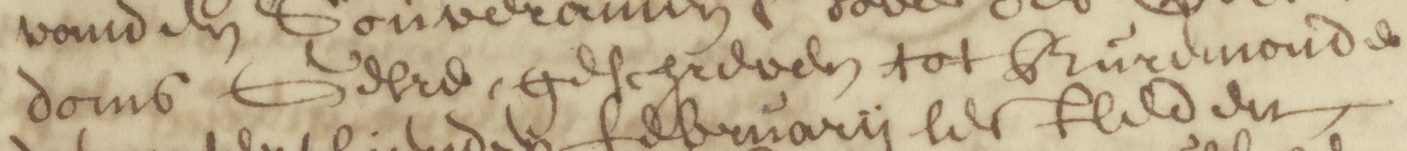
doms Gelre, geschreven tot Ruremonde
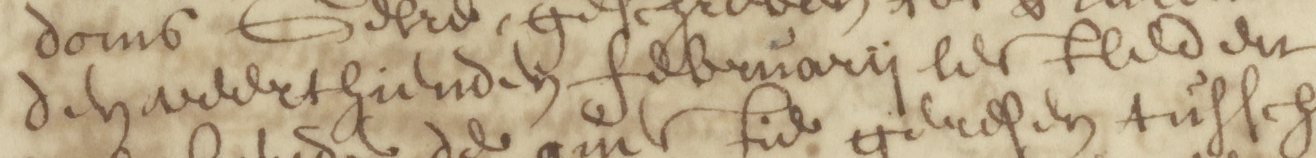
den veerthienden februarij lestleden,
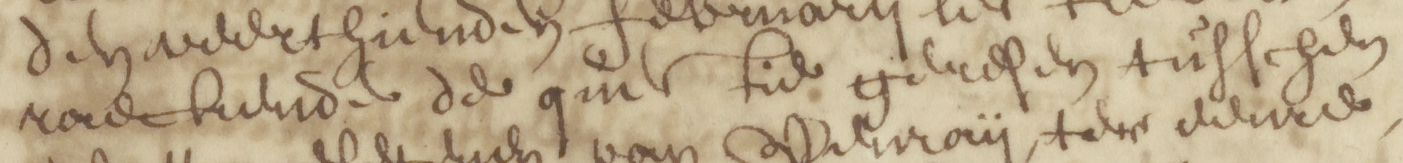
raeckende de questie geresen tusschen
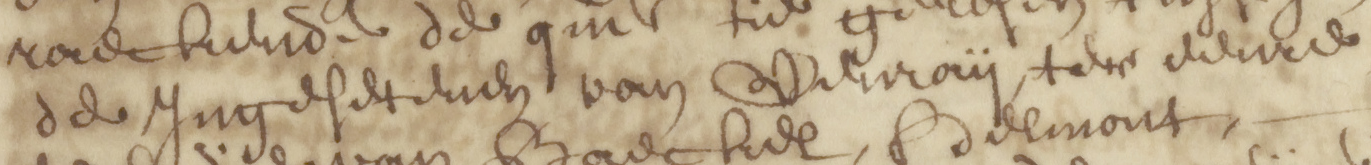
de Ingesetenen van Venraij ter eenre
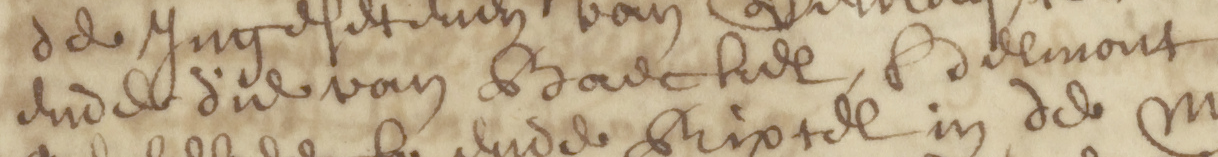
ende die van Baeckel, Helmont,
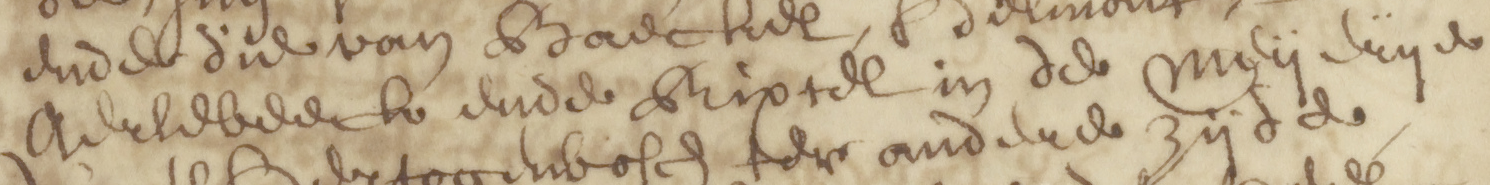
Aerlebeeck ende Rixtel in de meijerije
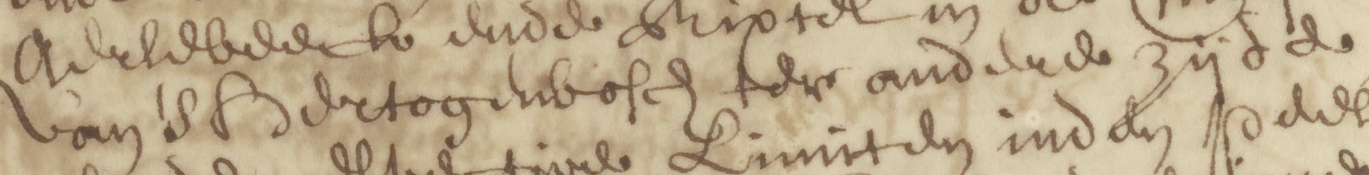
van ‛sHertogenbosch ter andere zijde
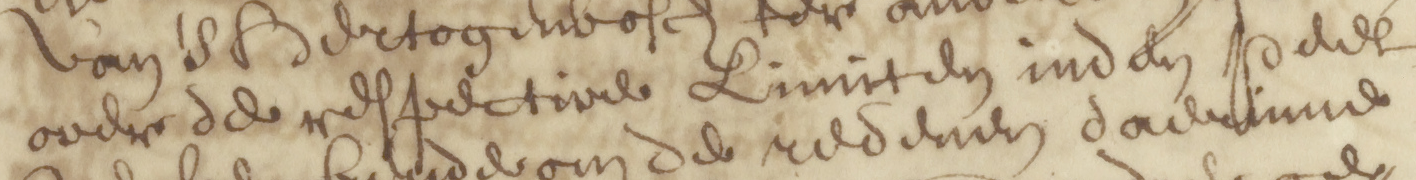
over de respective Limiten inden Peel,
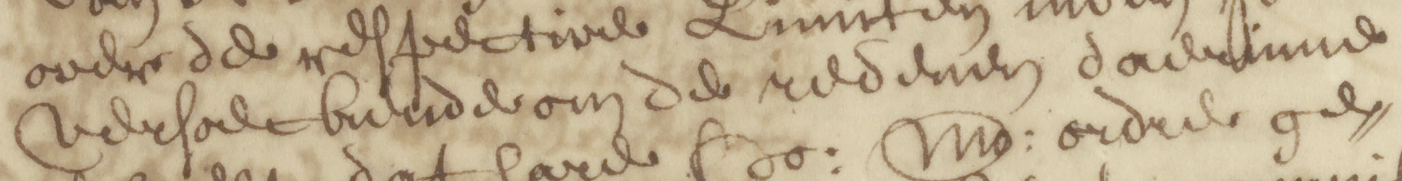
versoeckende om de redenen daerinne
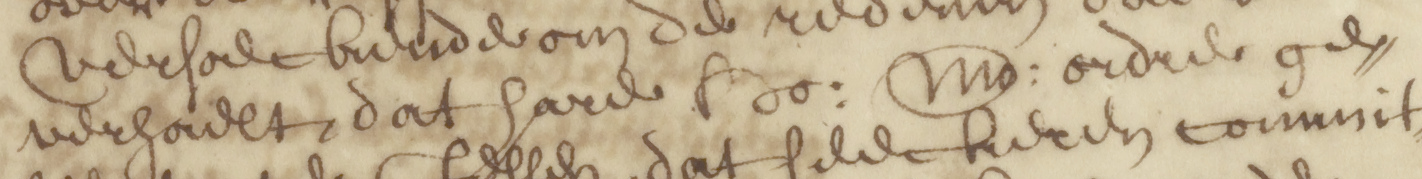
verhaelt, dat hare Ho:Mo: ordre ge„
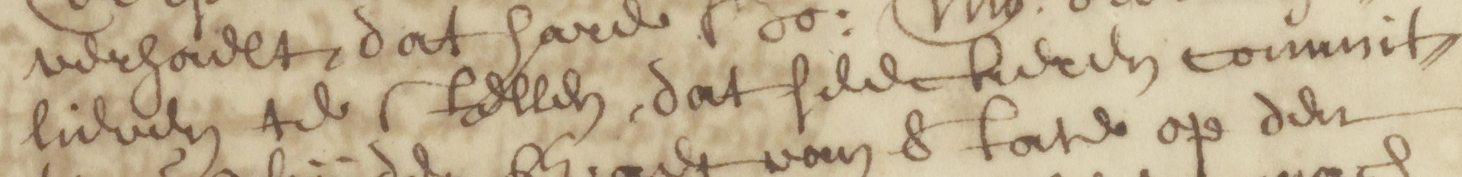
lieven te stellen, dat seeckeren commit„
